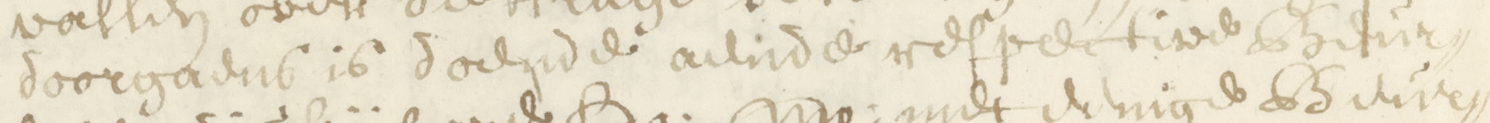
doorgaens is doende aende respective Beur„
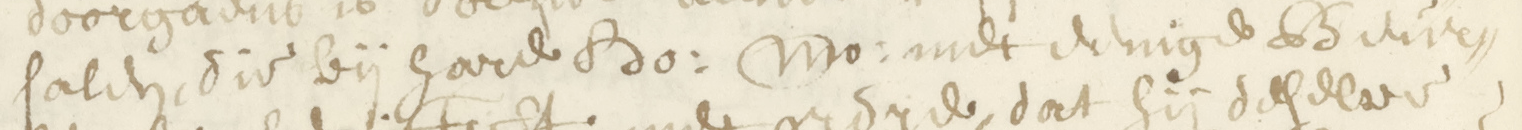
salen, die bij hare Ho:Mo: met eenige Beur„
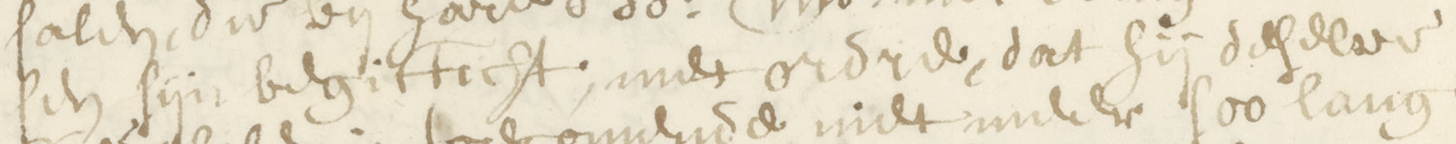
sen sijn begifticht; met ordre, dat hij deselve
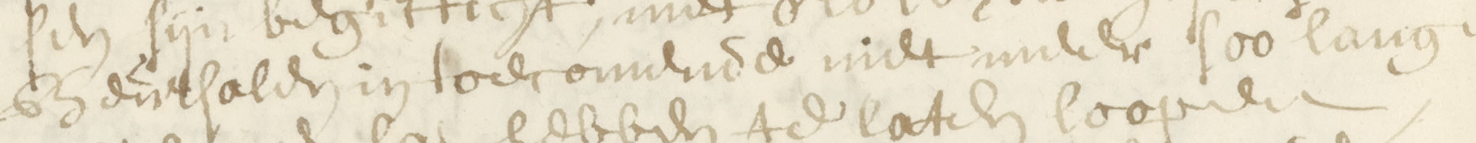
Beursalen in toecomende niet meer soo lange
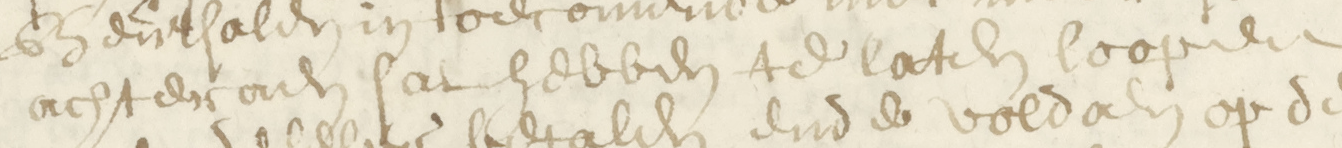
achteraen sal hebben te laten loopen
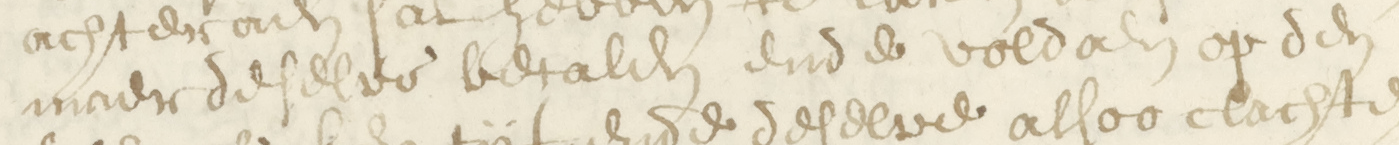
maer deselve betalen ende voldaen opden
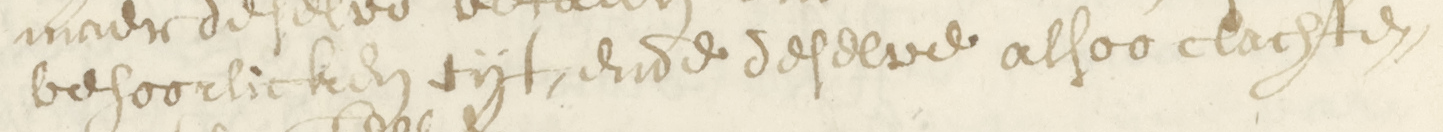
behoorlicken tijt, ende deselve alsoo clachte„
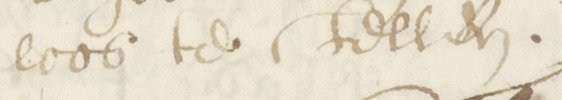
loos te stellen.
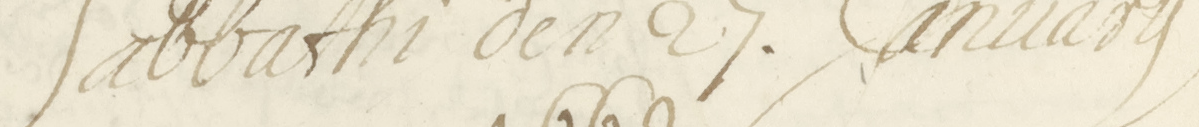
Sabbathi den 27e. Januarij
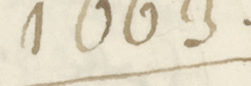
1663.
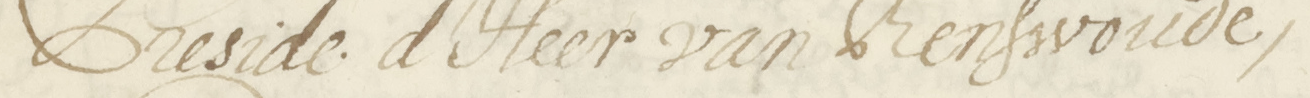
Preside d‛Heer van Renswoude,
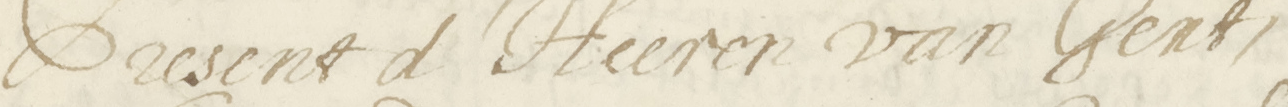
Present d‛Heeren van Gent,
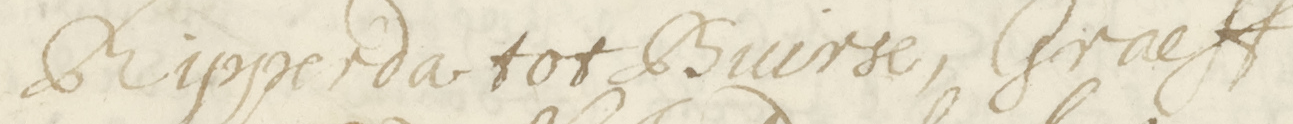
Ripperda tot Buirse, Graeff
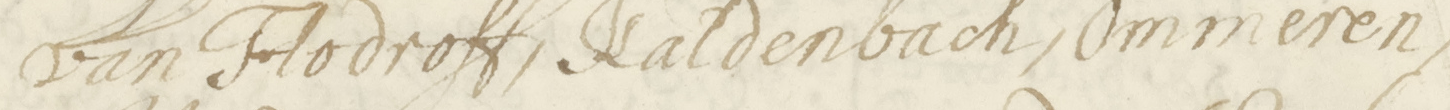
van Flodroff, Kaldenbach, Ommeren,
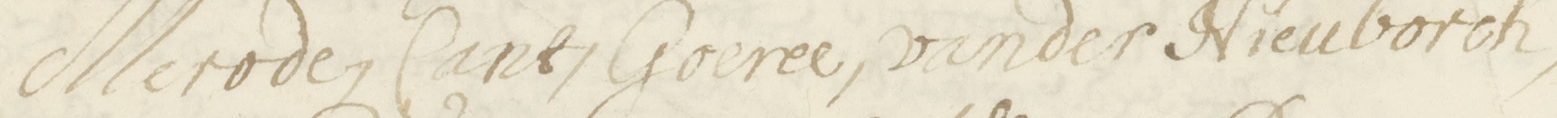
Merode, Cant, Goeree, van der Nieuborch,
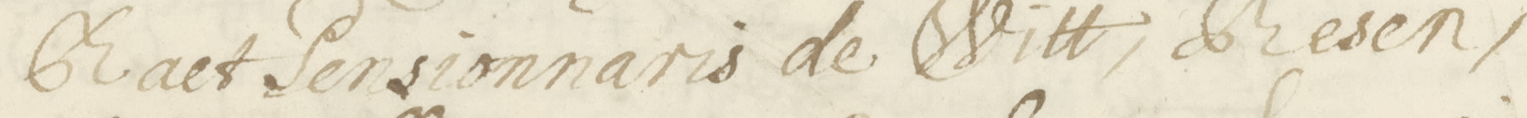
Raet Pensionnaris de Witt, Resen,
